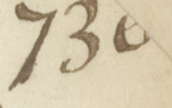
730
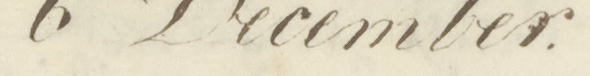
6 December.
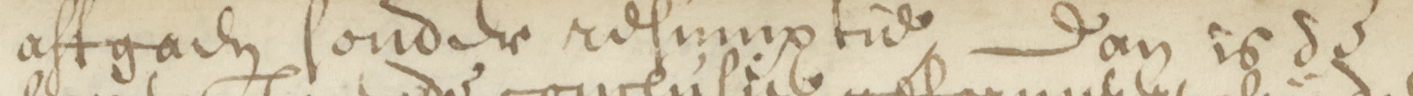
affgaen sonder resumptie, Dan is de
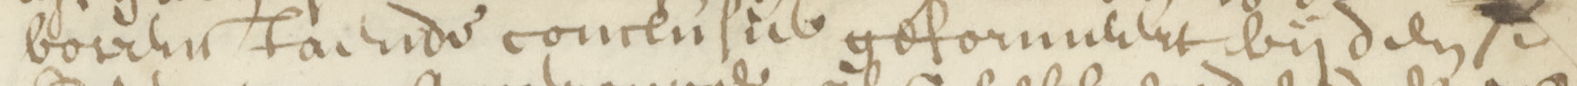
bovenstaende conclusie geformeert bij den
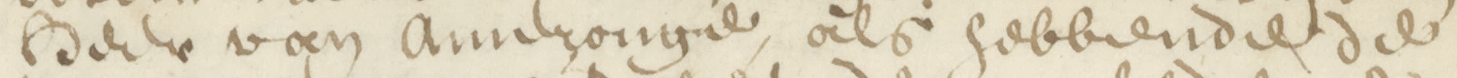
Heer van Ameronge, als hebbende de
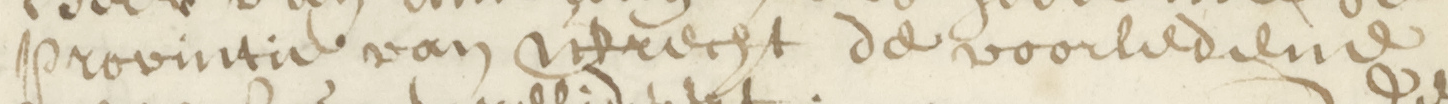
Provintie van Utrecht de voorledene
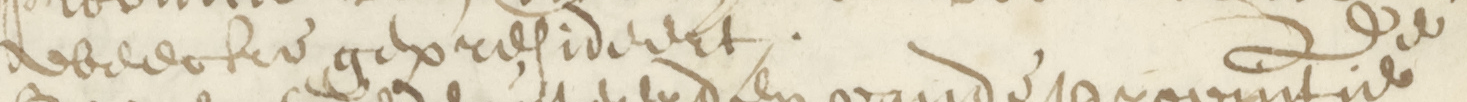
welcke gepresideert. De
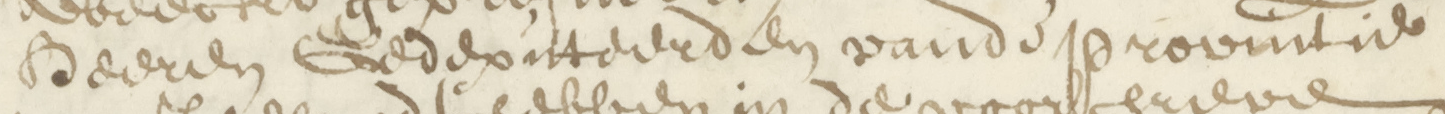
Heeren Gedeputeerden vande Provintie
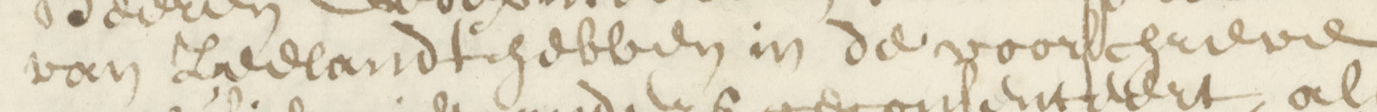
van Zeelandt hebben in de voorschreve
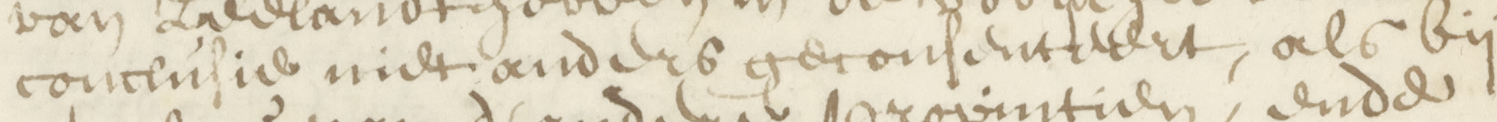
conclusie niet anders geconsenteert, als bij
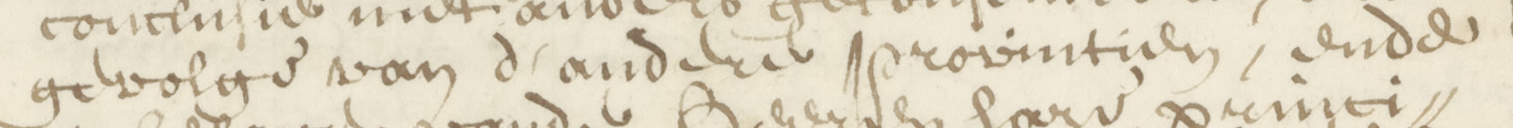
gevolge van d‛andere Provintien, ende
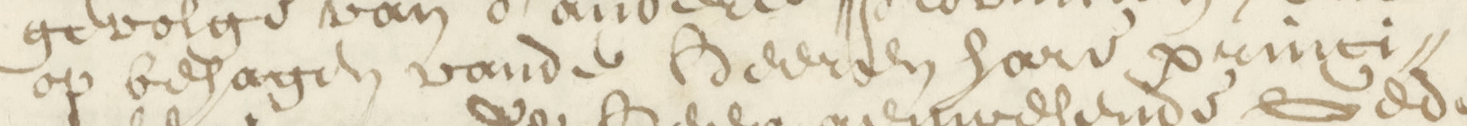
op behagen vande Heeren hare princi„
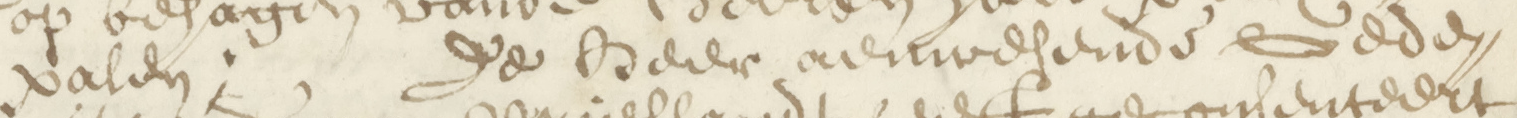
palen; De Heer aenwesende Gede„
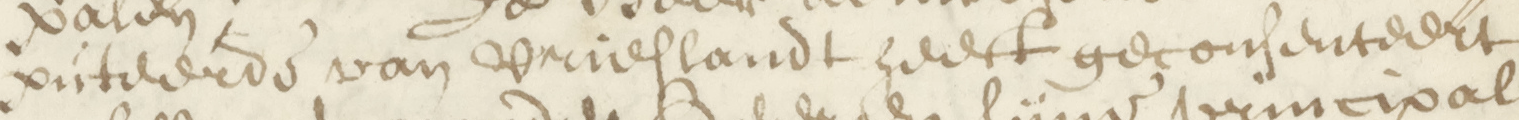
puteerde van Vrieslandt heeft geconcenteert
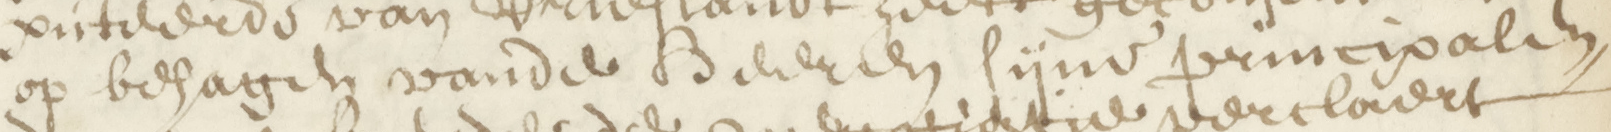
op behagen vande Heeren sijne principalen,
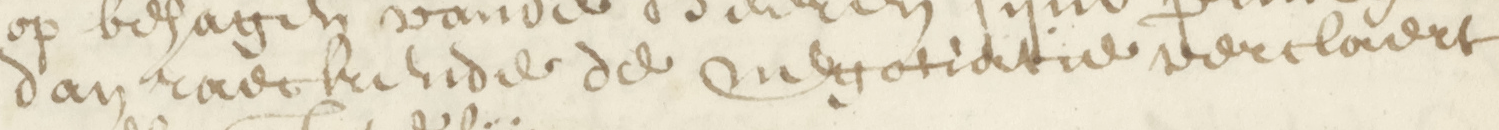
dan raeckende de negotiatie verclaert
